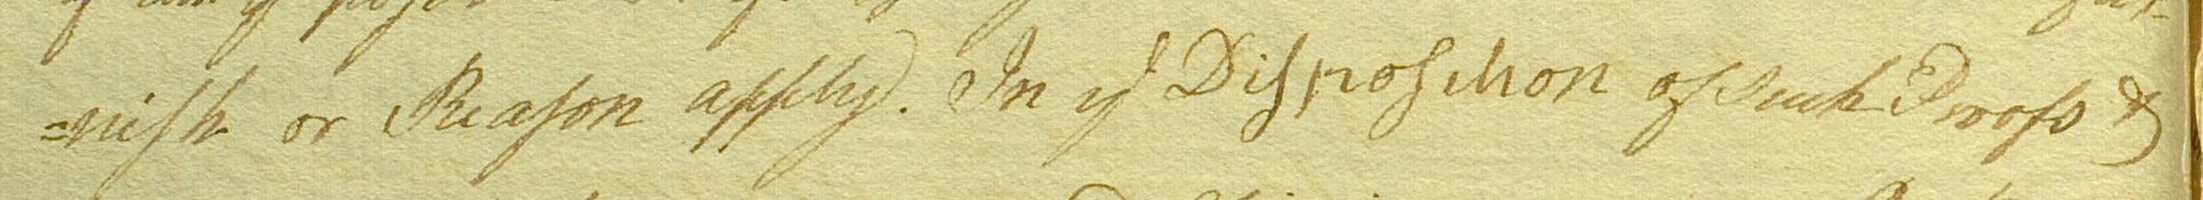-nish or Reason apply. In y^e Disposition of weak Proofs &
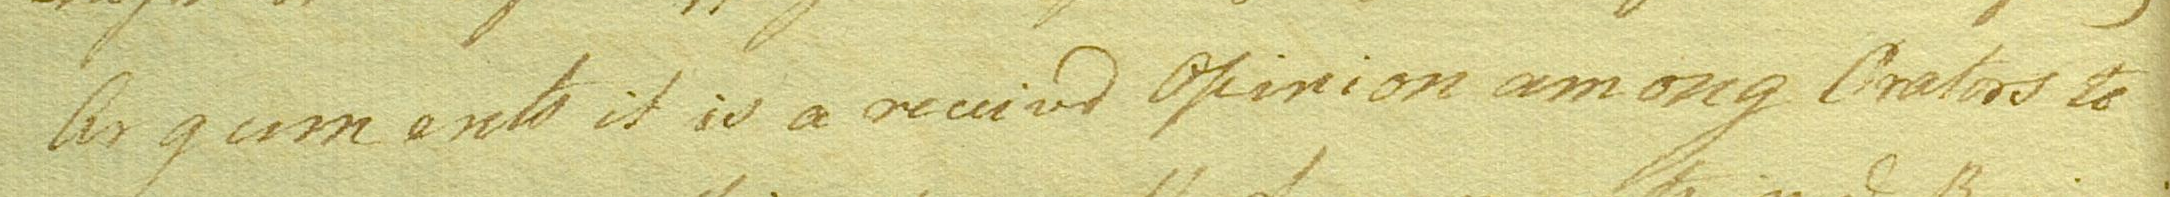Arguments it is a receivd Opinion among Orators to
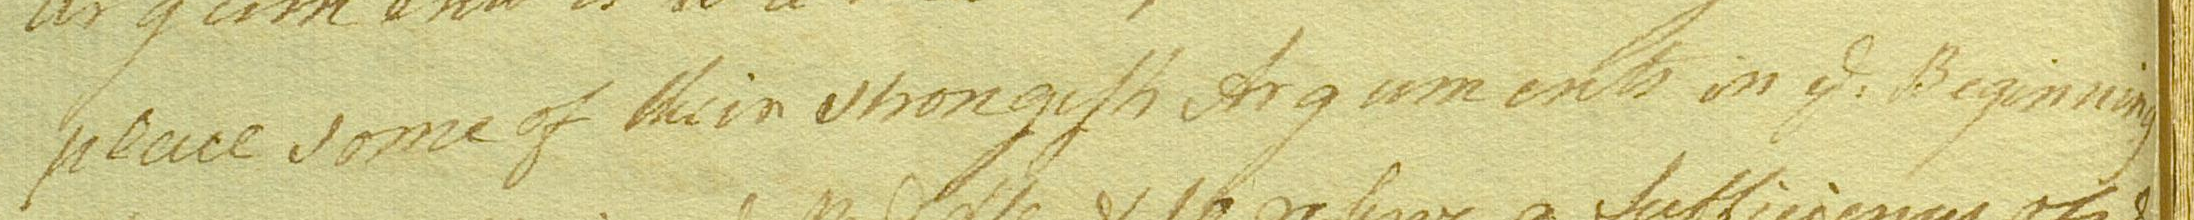place some of their strongest Arguments in y^e: Beginning
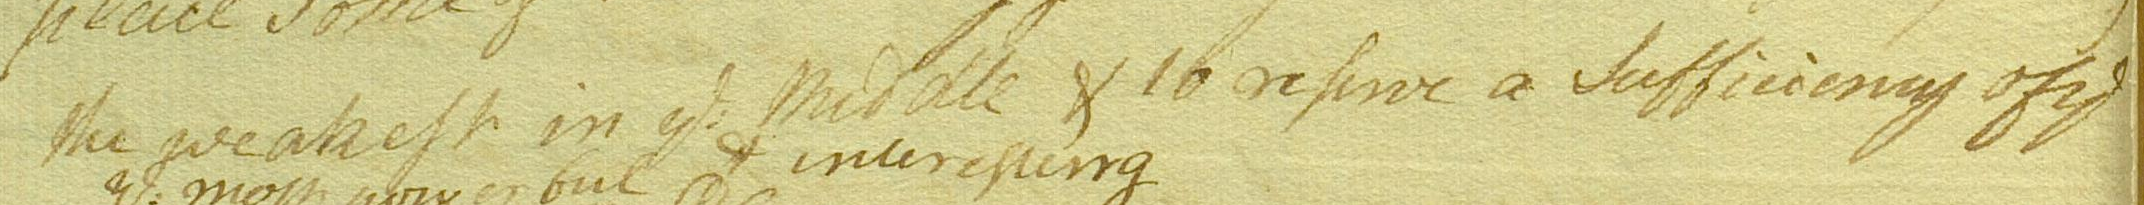the weakest in y^e: Midle & to refine a Sufficiency of y^e
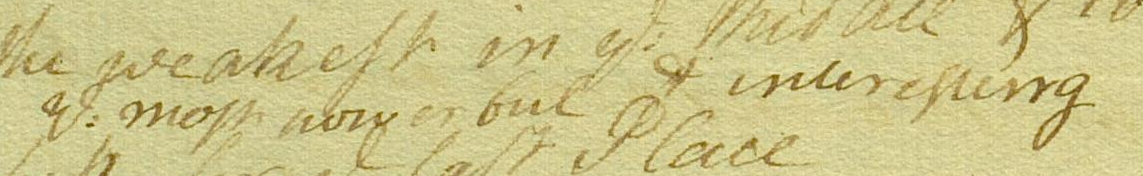y^e: most powerful & interesting
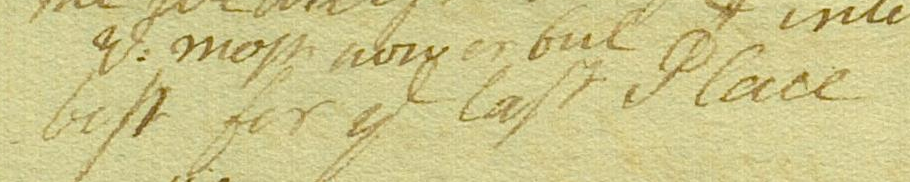best for y^e last Place
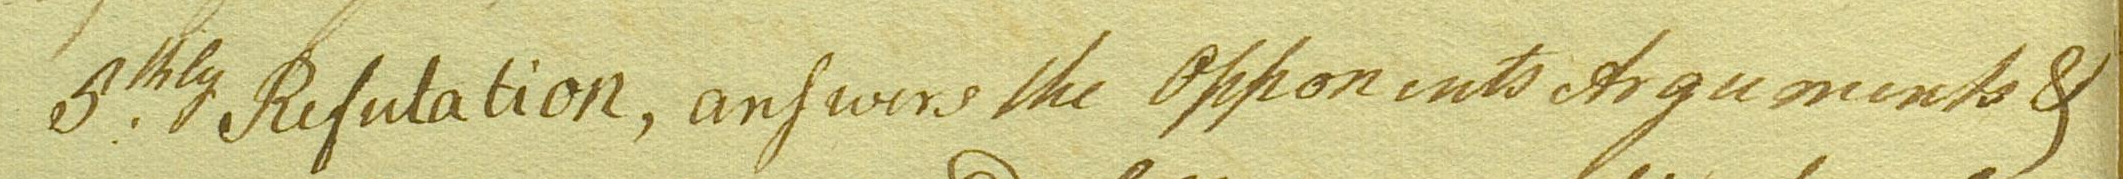5^thly. Refutation, answers the Opponents Arguments &
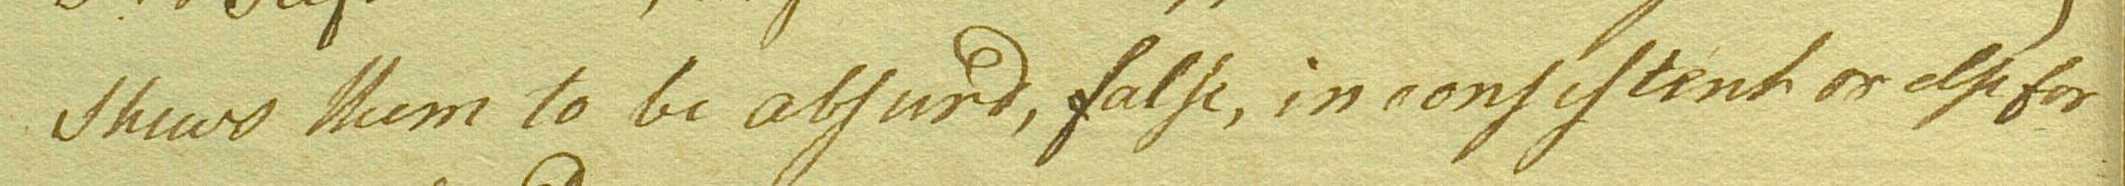Shews them to be absurd, false, inconsistent or else for
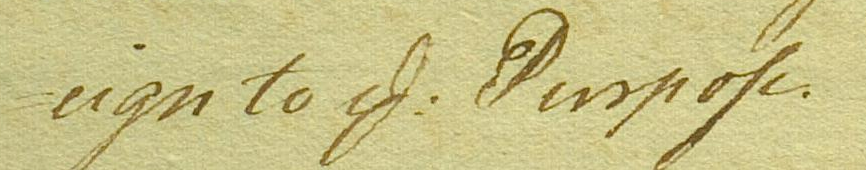-eign to y^e: Purpose.
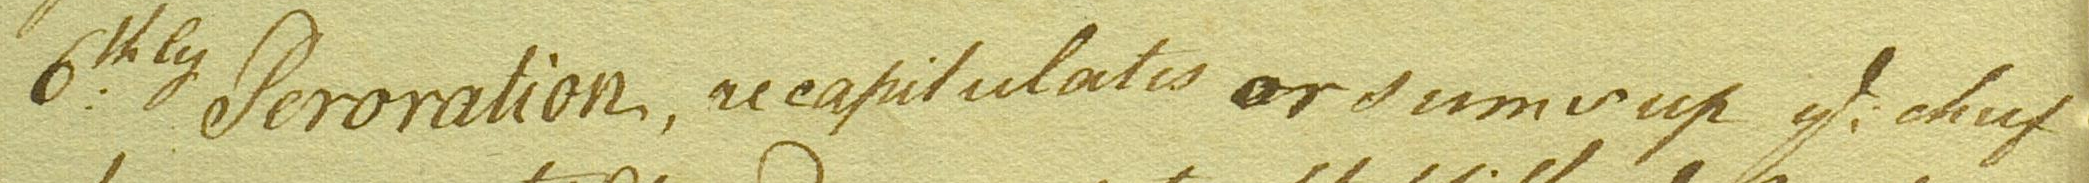6^thly: Peroration, recapitulates or sums up y^e: chief
